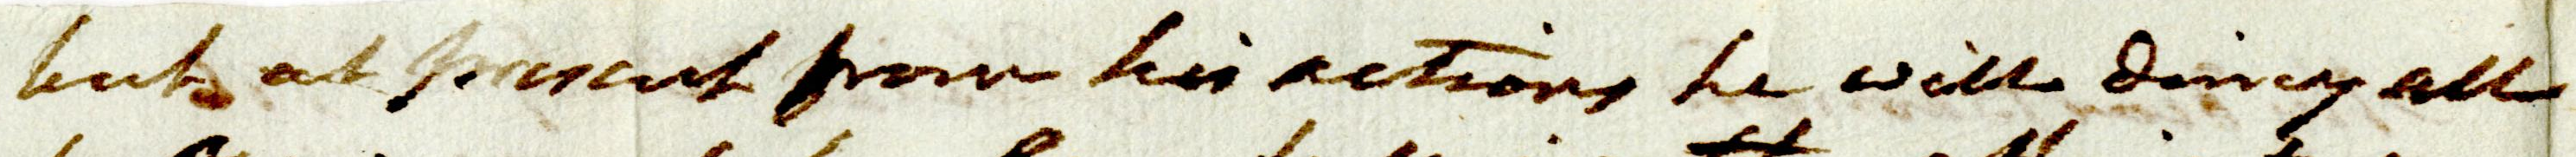but at present from his actions he will doing all
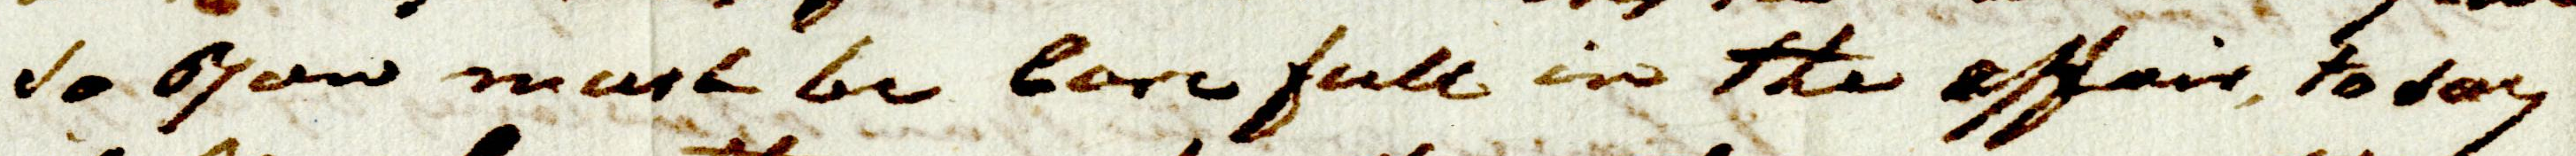so you must be Carefull in the affair to say
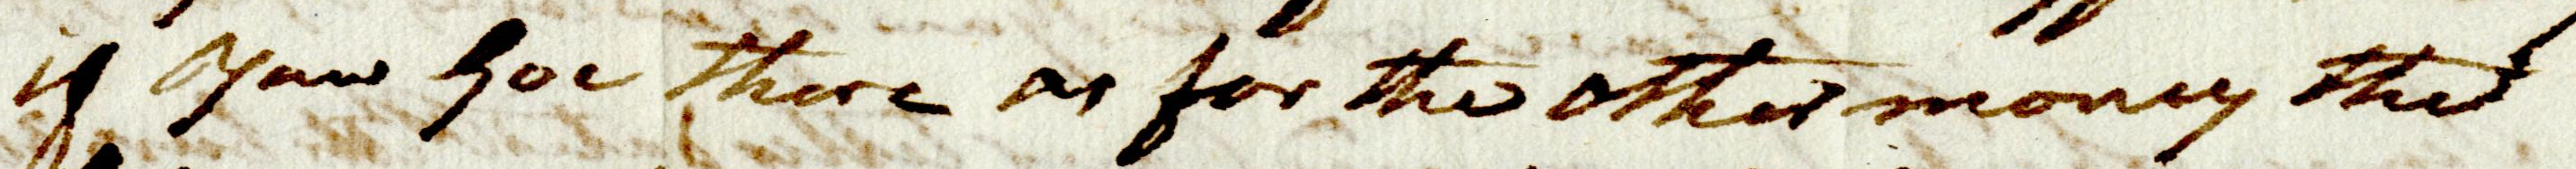if you goe there as for the other money the
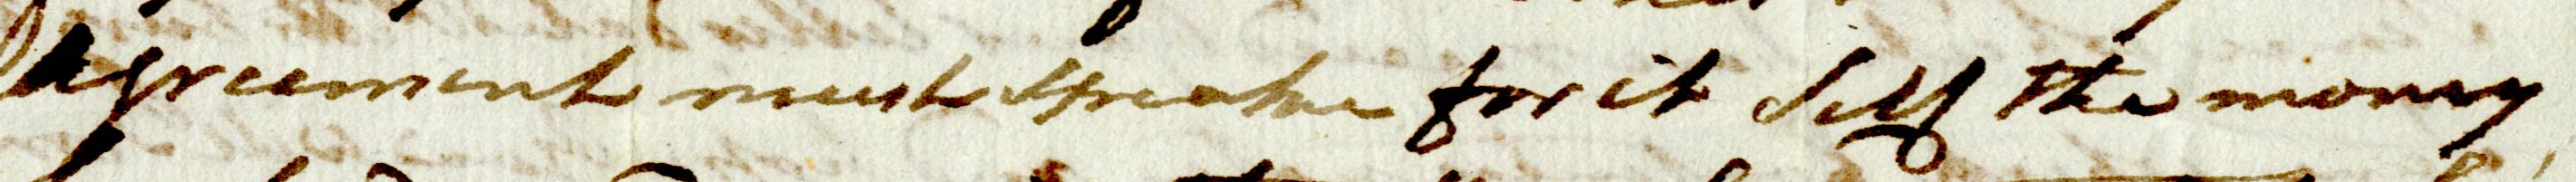agreement must speake for it self the money
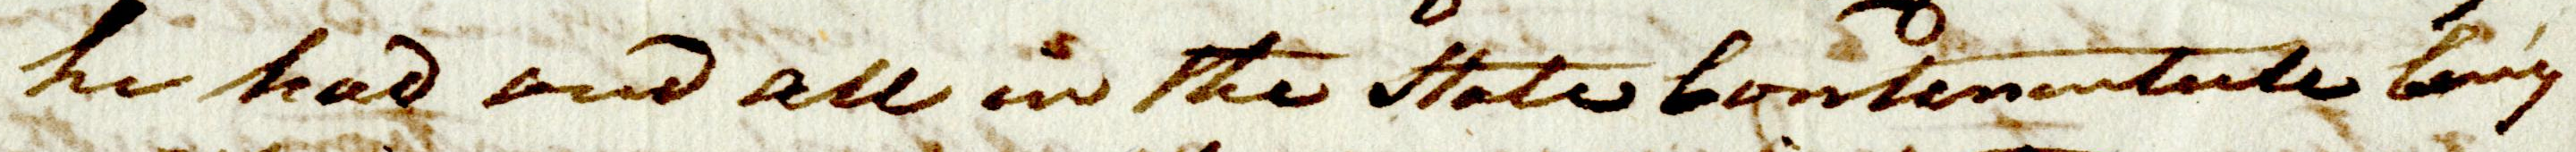he had and all in the States Contemplate being
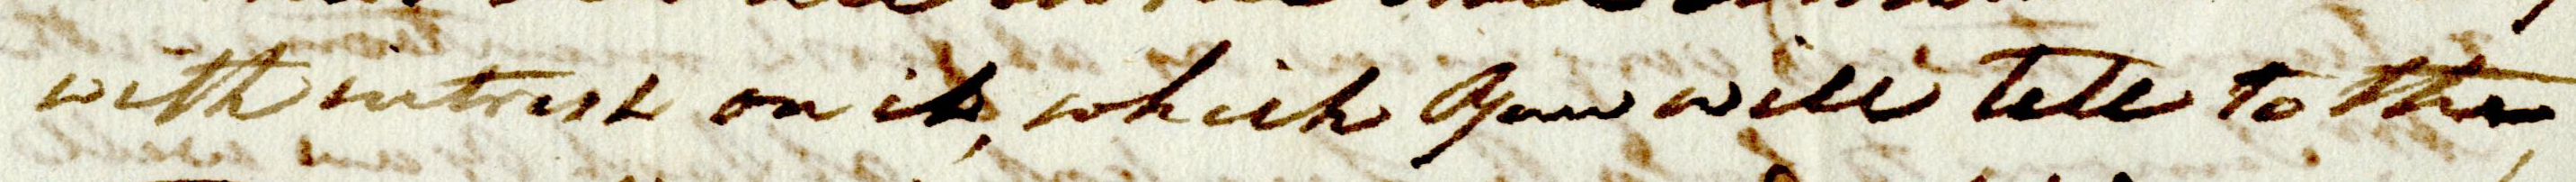with interest on it, which you will tell to the
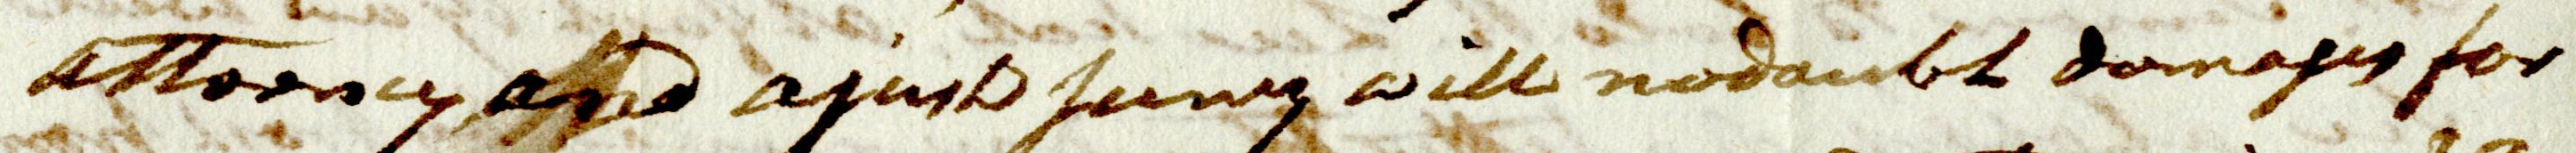attorney and ajust Jury will no doubt damages for
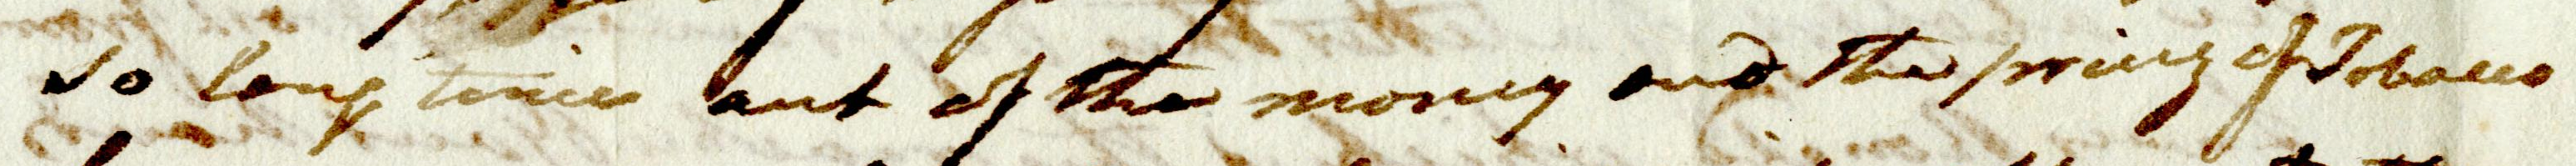so long time and of the money and the pricing of Tobacco
